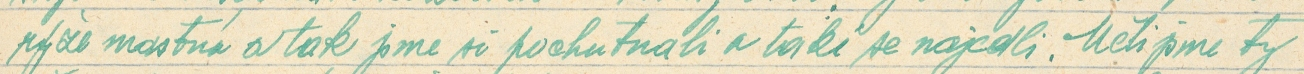rýže mastná a tak jsme si pochutnali a také se najedli. Měli jsme ty
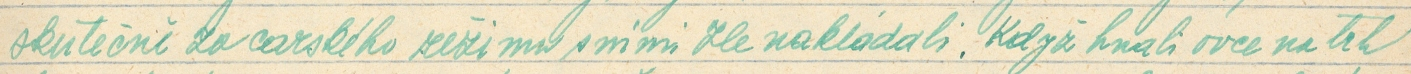skutečně za carského režimu s ními zle nakládali. Když hnali ovce na trh
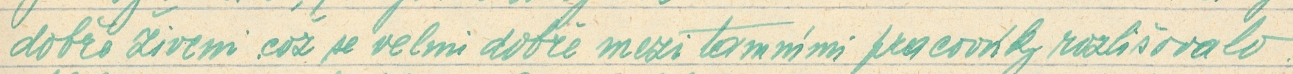dobře živeni což se velmi dobře mezi tamními pracovníky rozlišovalo.
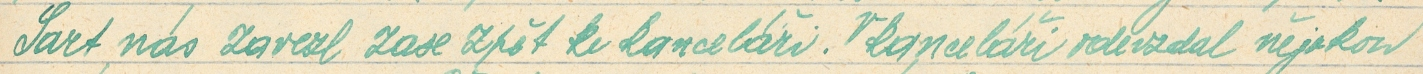Sart nás zavezl zase zpět ke kanceláři. V kanceláři odevzdal nějakou
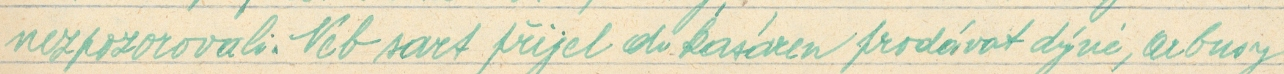nezpozorovali. Neb sart přijel do kasáren prodávat dýni, arbusy
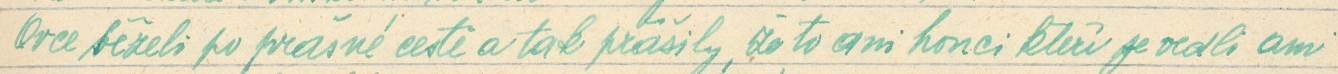Ovce běželi po prašné cestě a tak prášily, že to ani honci kteří je vedli ani
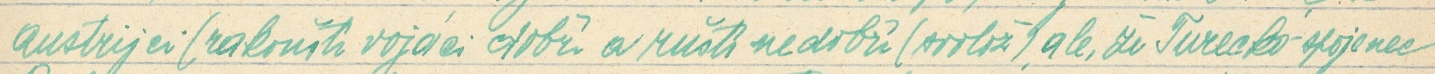austrijci (rakouští vojáci dobří a ruští nedobří (svolož), ale, že Turecko-spojenec
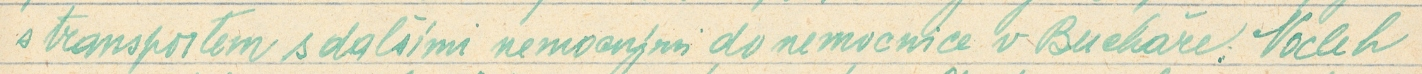s transportem s dalšími nemocnými do nemocnice v Buchaře. Nocleh
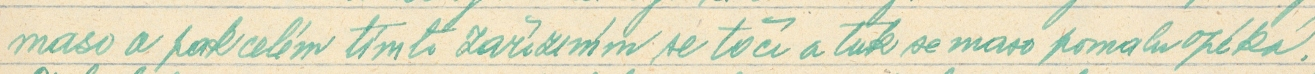maso a pak celém tímto zařízením se točí a tak se maso pomalu opéká.
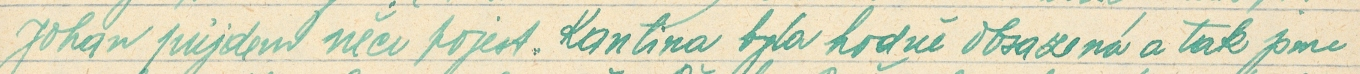Johan půjdem něco pojest. Kantina byla hodně obsazená a tak jsme
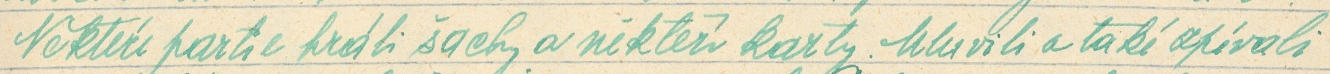Některé partie hráli šachy a někteří karty. Mluvili a také zpívali
